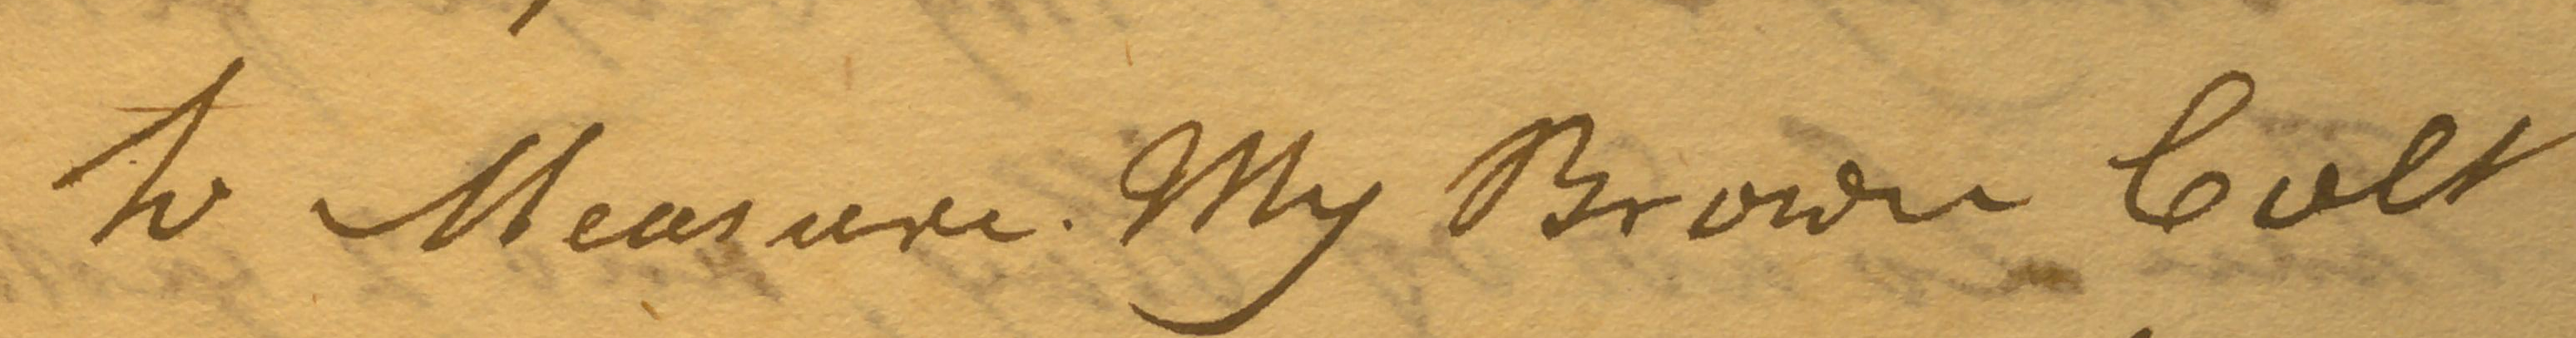to Measure. My Brown Colt
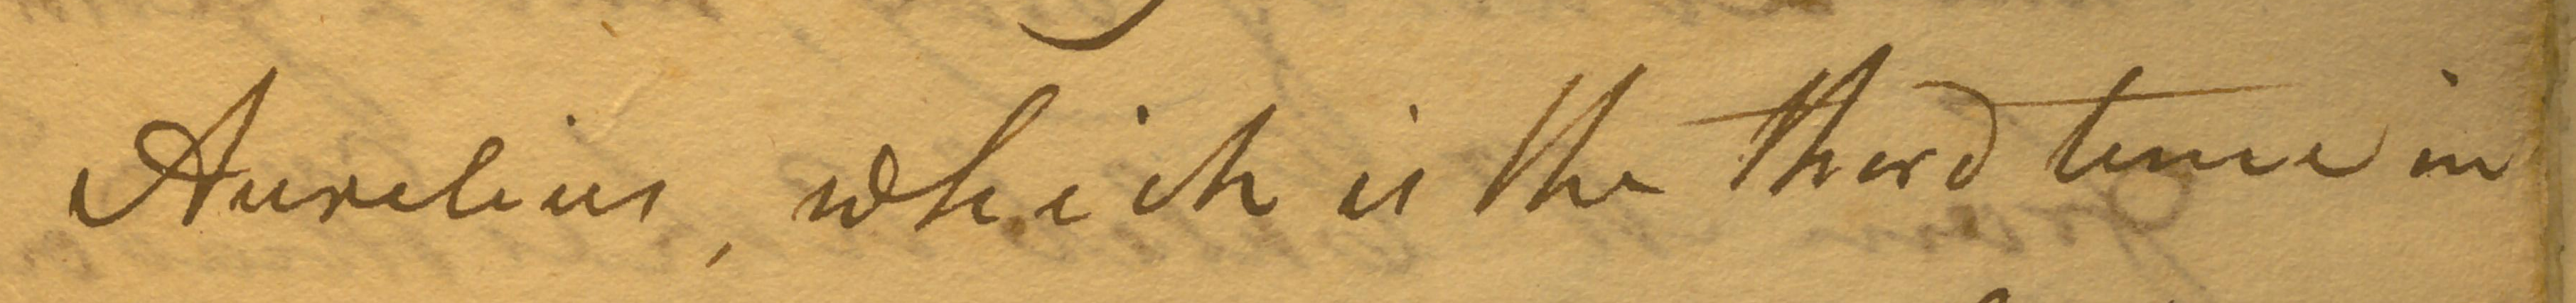Aurelius which is the third time in
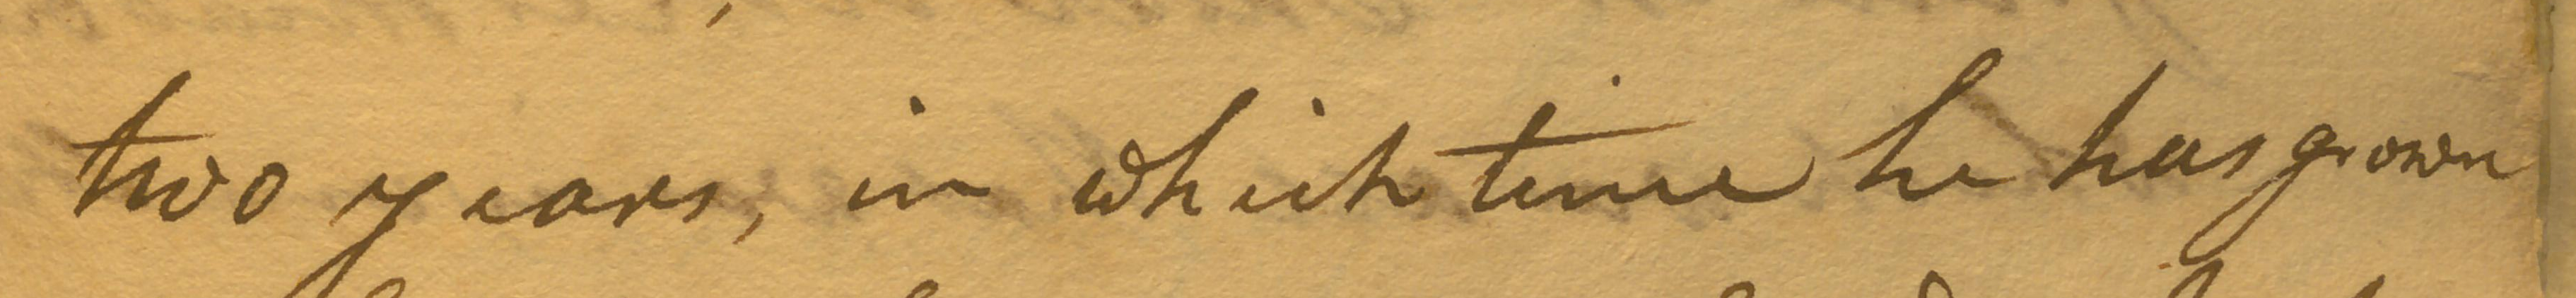two years, in which time he has grown
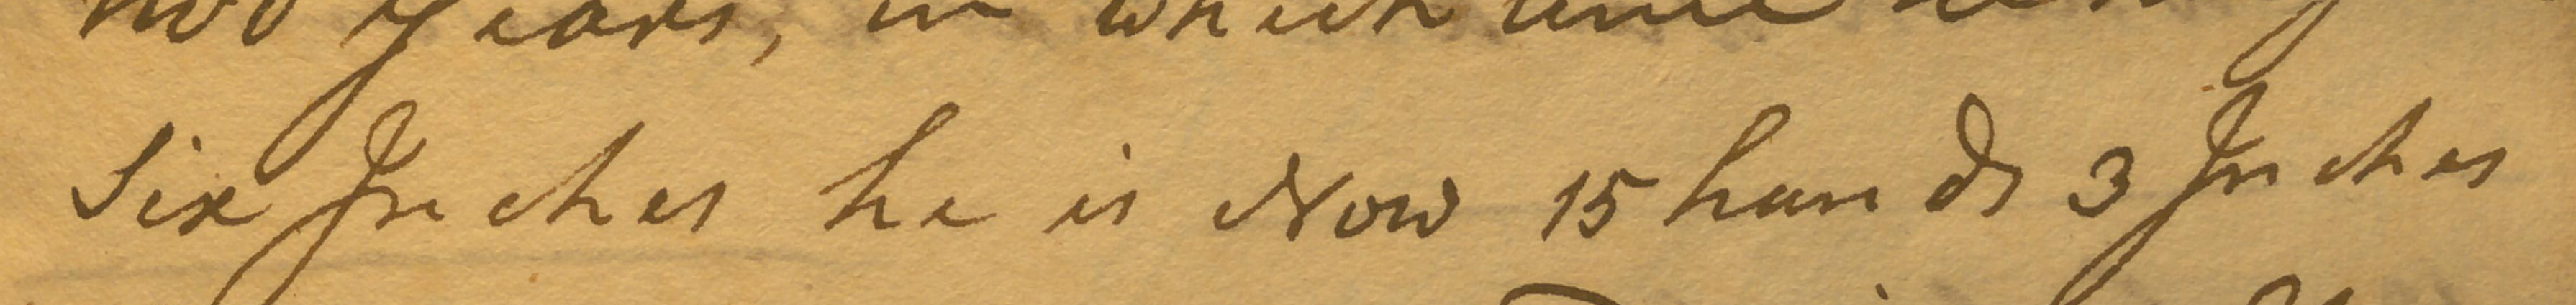six Inches he is Now 15 hands 3 Inches
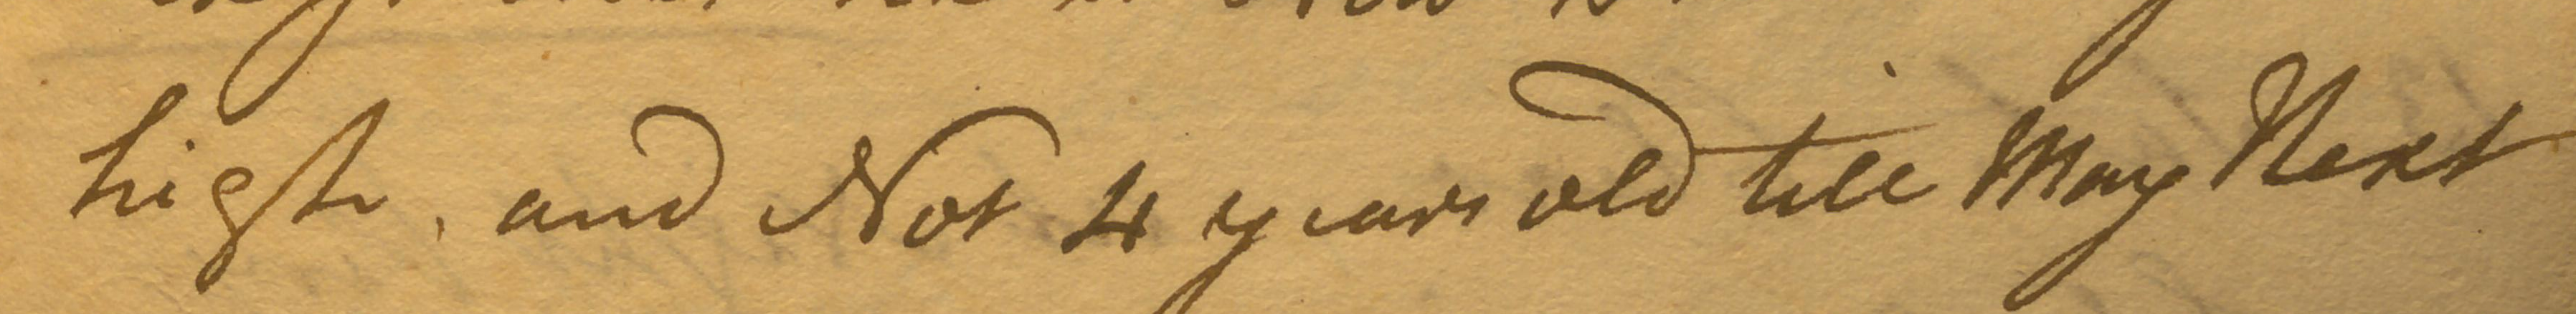high, and Not 4 years old till May Next
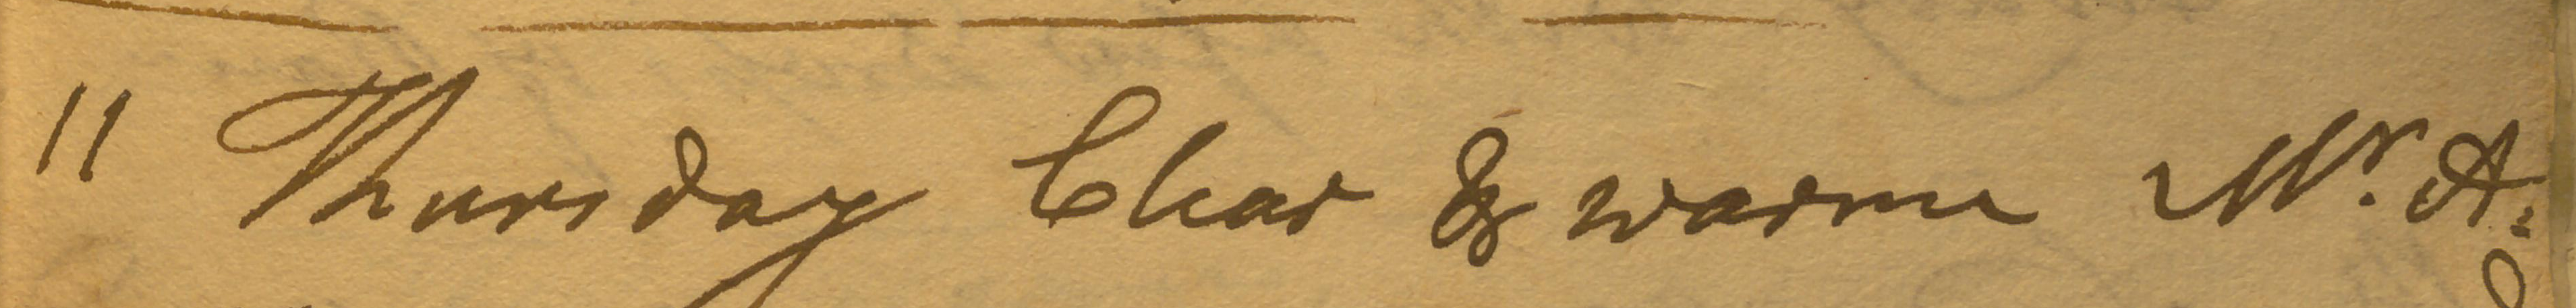11 Thursday Clear & warme M^r. A
